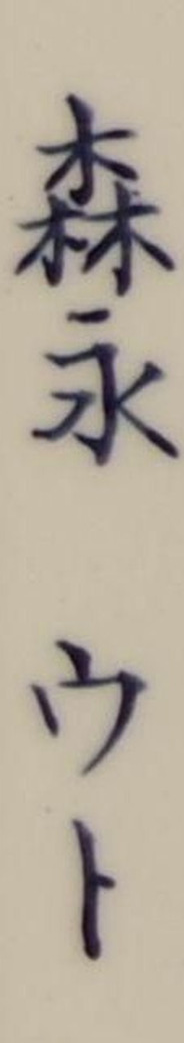森永ウト

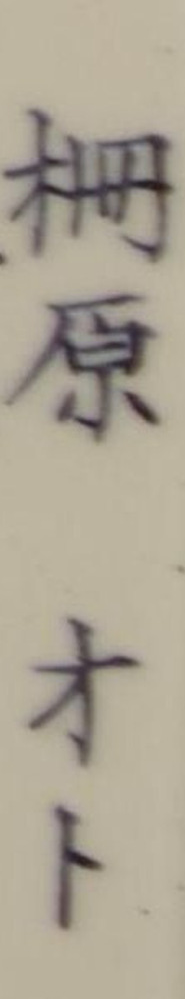柵原オト
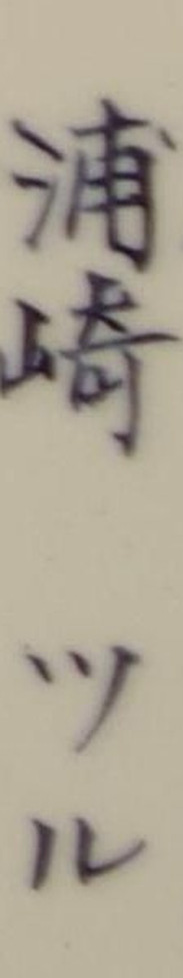浦崎ツル
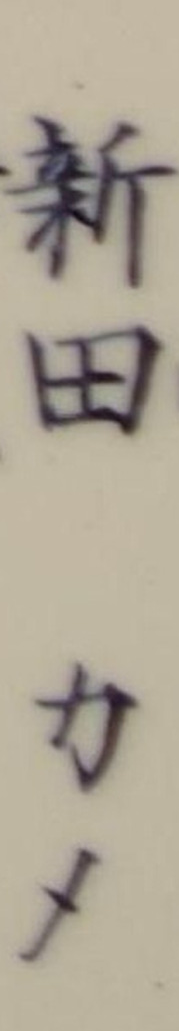新田力メ
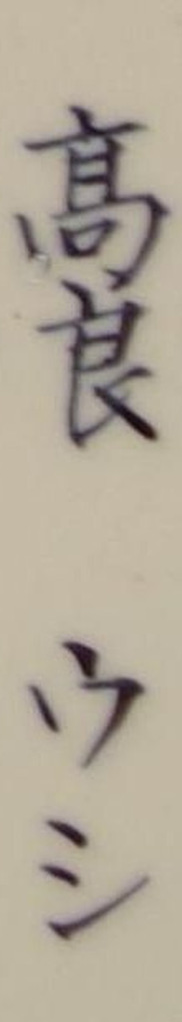高良ウシ
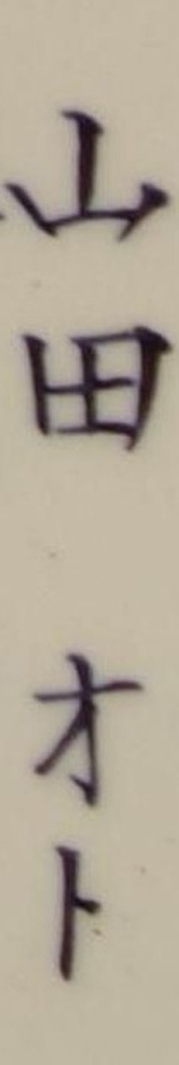山田オト
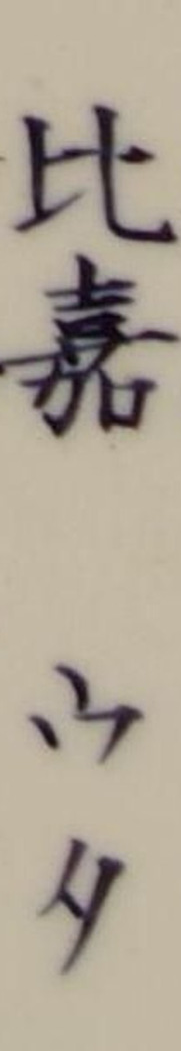比嘉ウタ
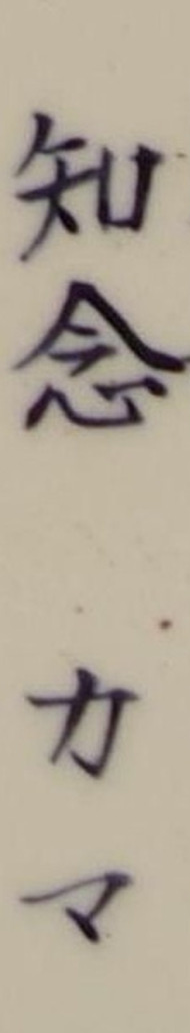知念カマ
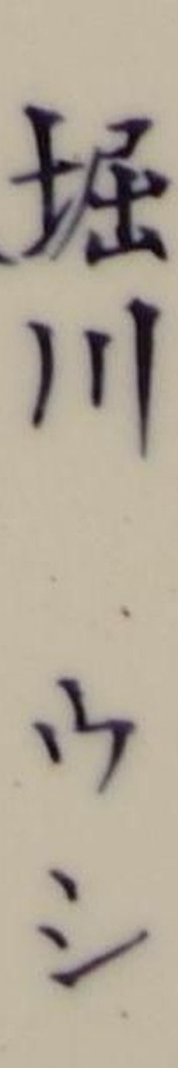堀川ウシ
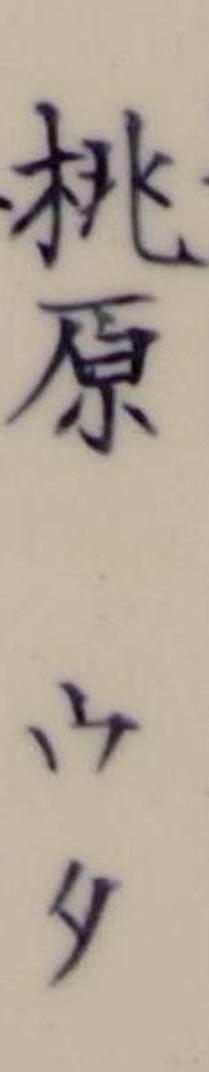桃原ウタ
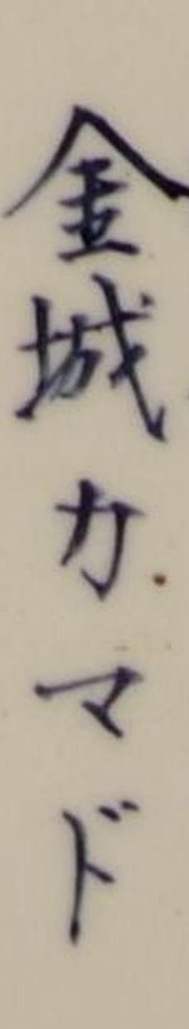金城力マド
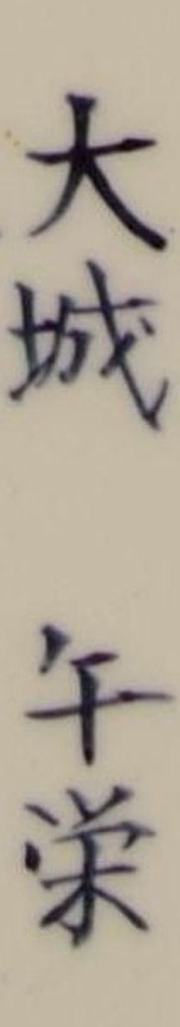大城午栄
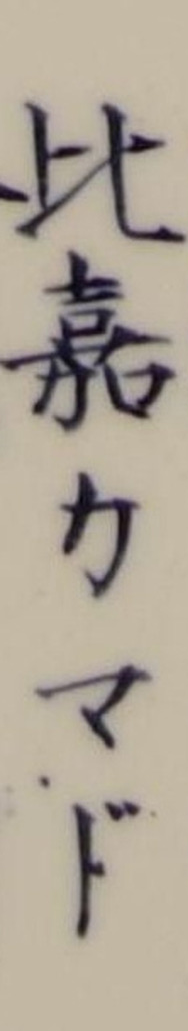此嘉カマド
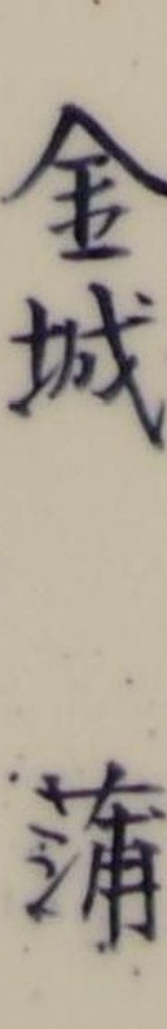金城蒲
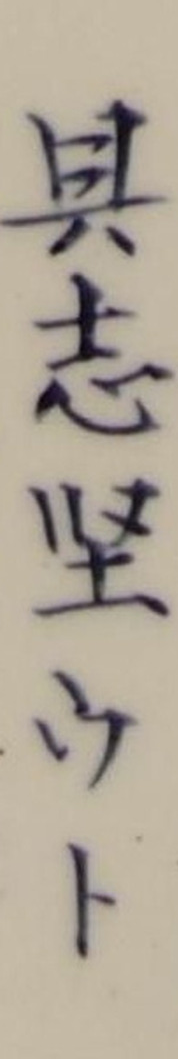具志堅ウト
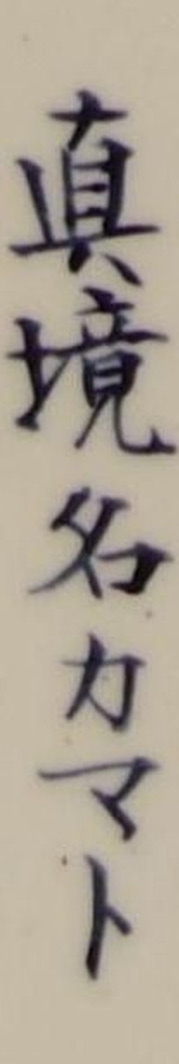真境名カマト
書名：E~L
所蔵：高野山金剛峯寺
